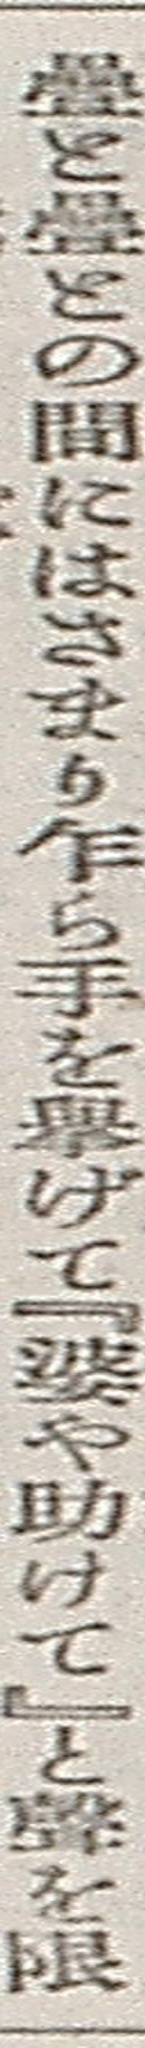畳と畳との間にはさまり乍ら手を挙げて『婆や助けて』と声を限
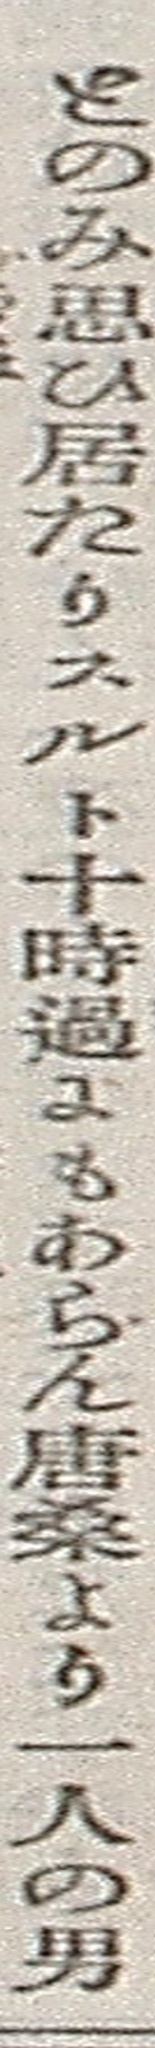とのみ思ひ居たりスルト十時過にもあらん唐桑より一人の男
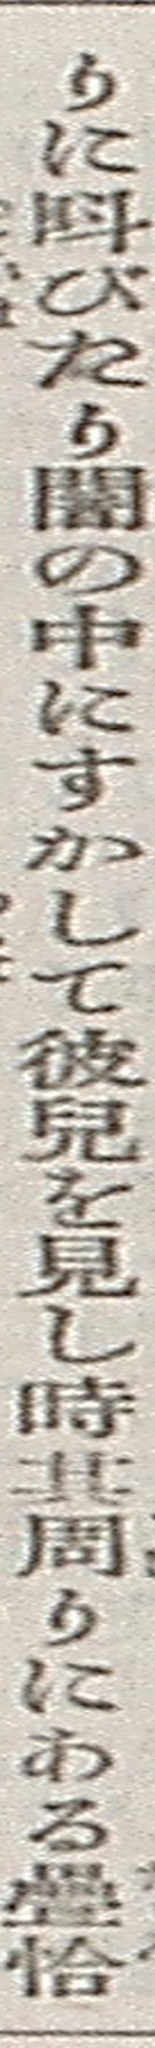りに叫びたり闇の中にすかして彼児を見し時其周りにある畳恰
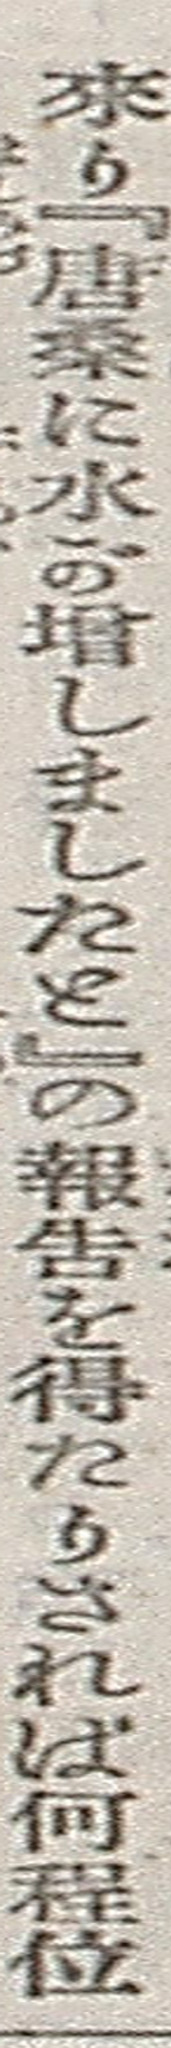来り『唐桑に水が増しましたと』の報告を得たりされば何程位
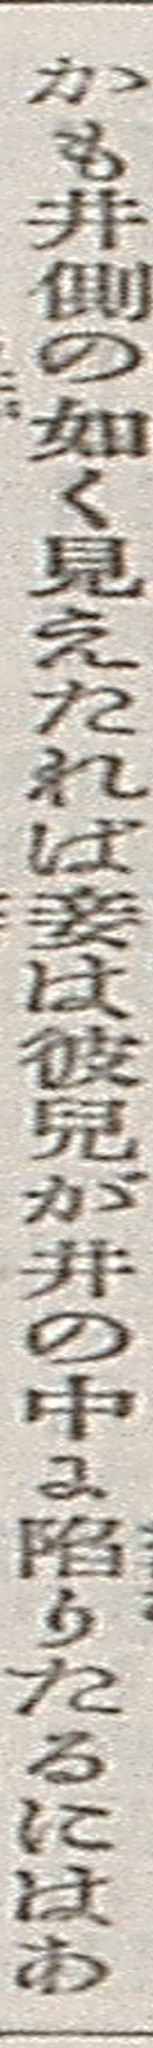かも井側の如く見えたれば妾は彼児が井の中に陥りたるにはあ
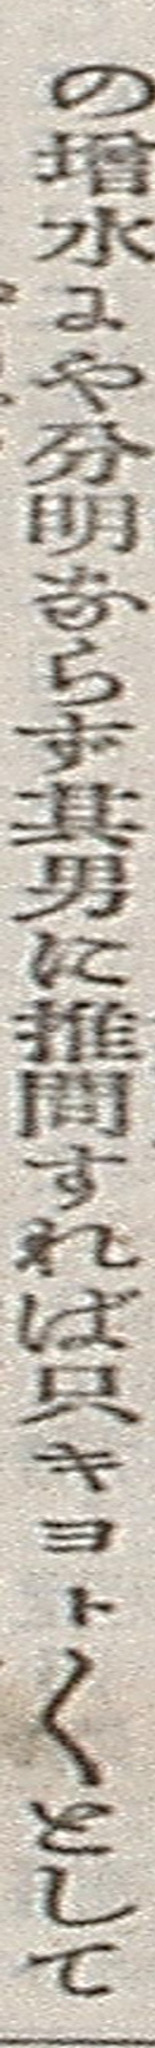の増水にや分明ならず其男に推問すれば只キヨト〳〵として
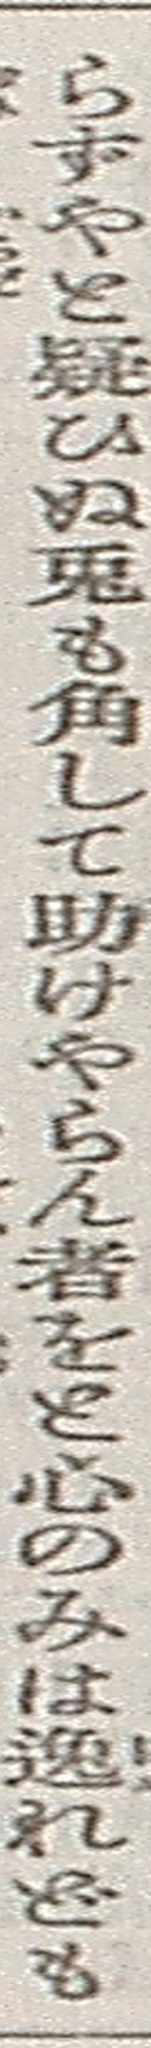らずやと疑ひぬ兎も角して助けやらん者をと心のみは逸れども
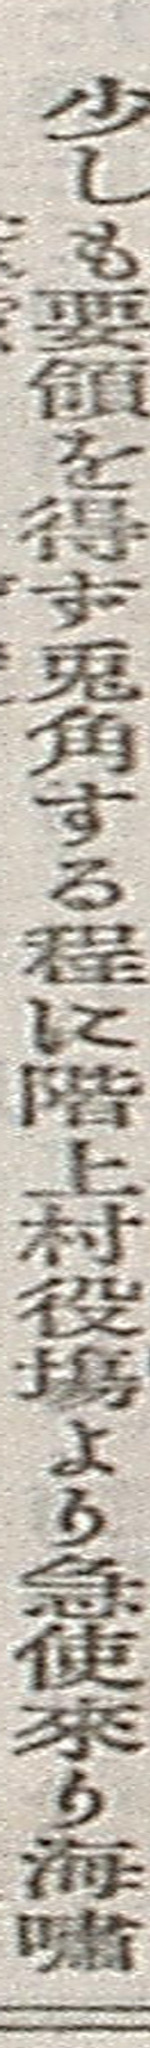少しも要領を得ず兎角する程に階上村役場より急使来り海嘯
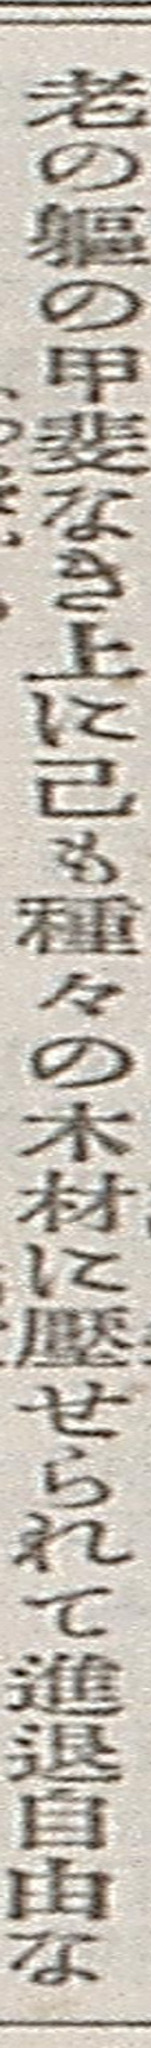老の身の甲斐なき上に己も種々の木材に圧せられて進退自由な
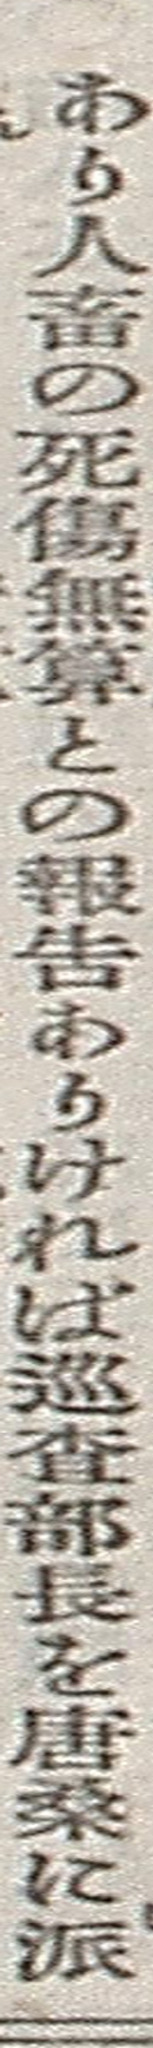あり人畜の死傷無算との報告ありければ巡査部長を唐桑に派
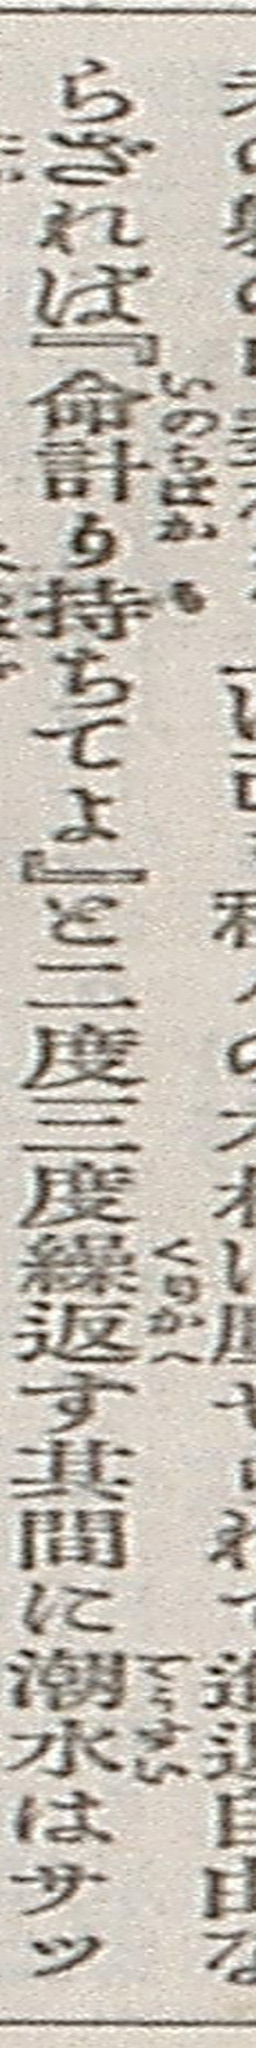らざれば『命計り持ちてよ』と二度三度繰返す其間に潮水はサッ
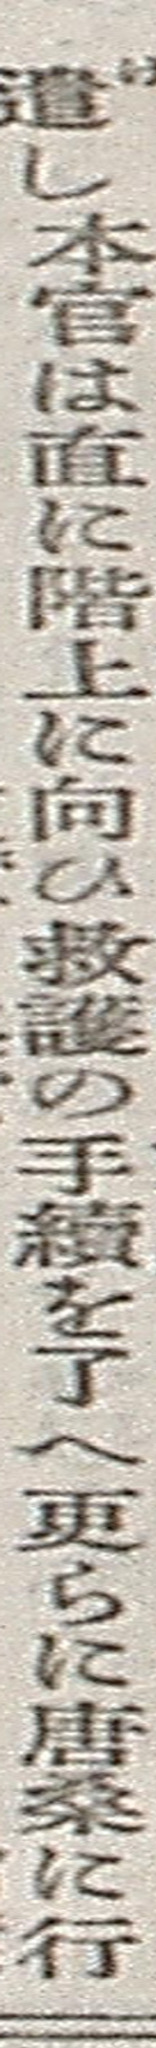遣し本官は直に階上に向ひ救護の手続を了へ更らに唐桑に行
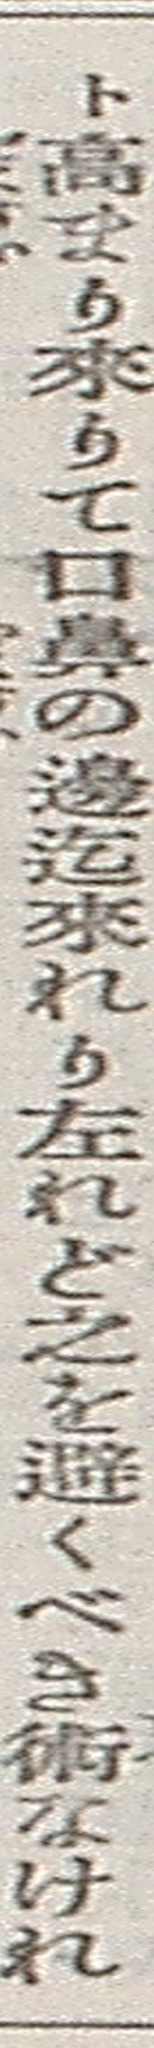ト高まり来りて口鼻の辺迄来れり左れど之を避くべき術なけれ
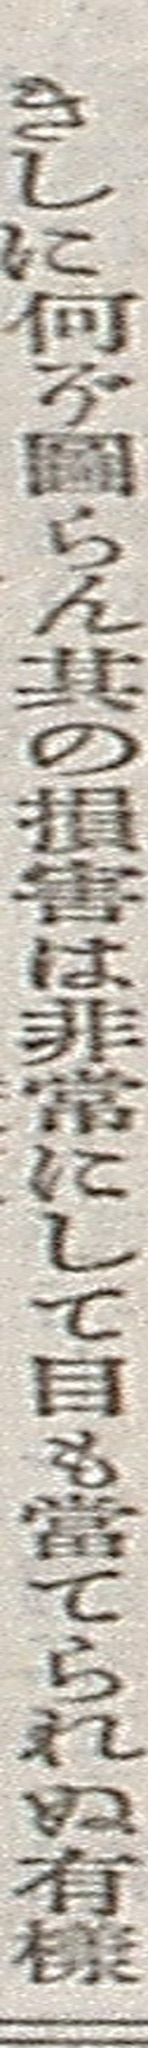きしに何ぞ図らん其の損害は非常にして目も当てられぬ有様
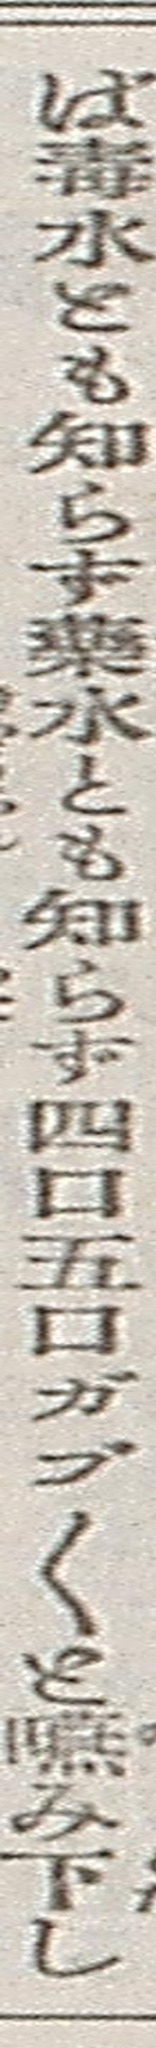ば毒水とも知らず薬水とも知らず四口五口ガブ〳〵と嚥み下し
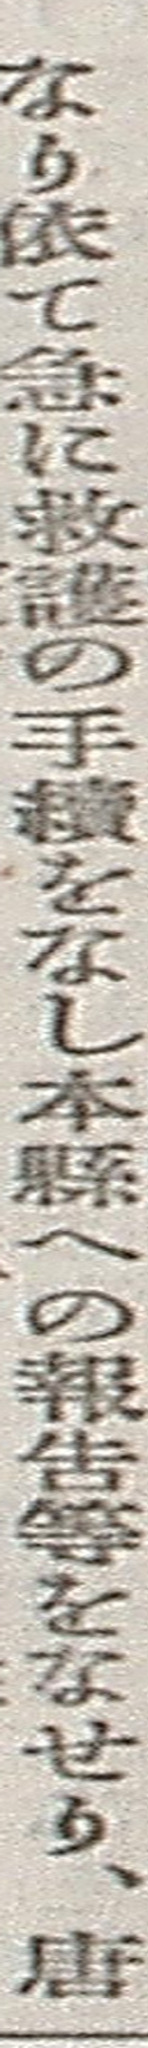なり依て急に救護の手続をなし本県への報告等をなせり、唐
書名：風俗畫報臨時増刊第百十九號　大海嘯被害録（中）
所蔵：東京大学地震研究所図書室 Earthquake Research Institute Library, The University of Tokyo, JAPAN
